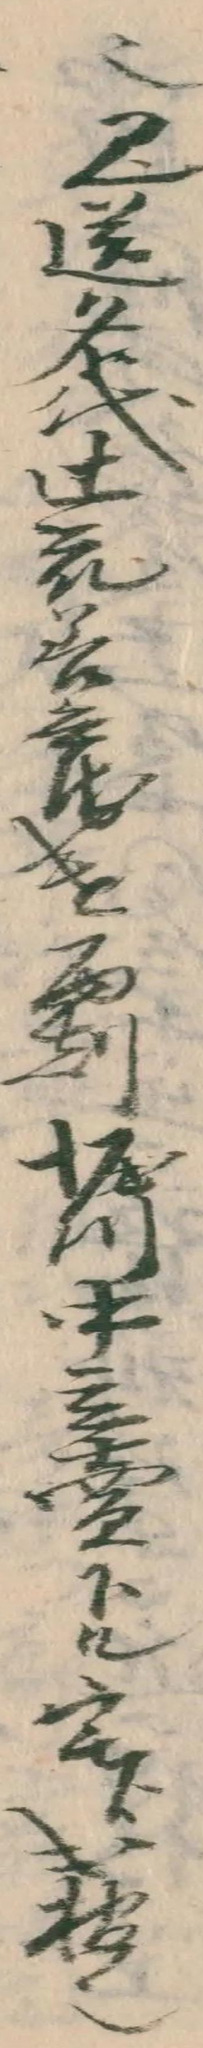也見送名代辻花善兵衛遣酉刻堀川中立売下ル宅ゟ出棺也
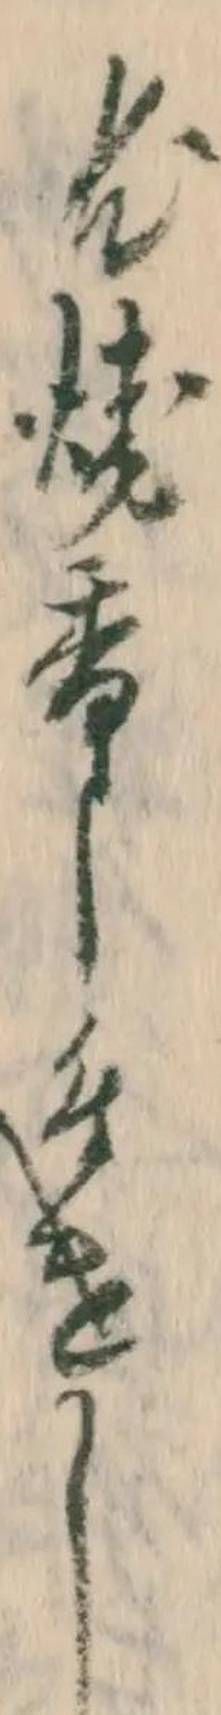尤焼香申付遣了
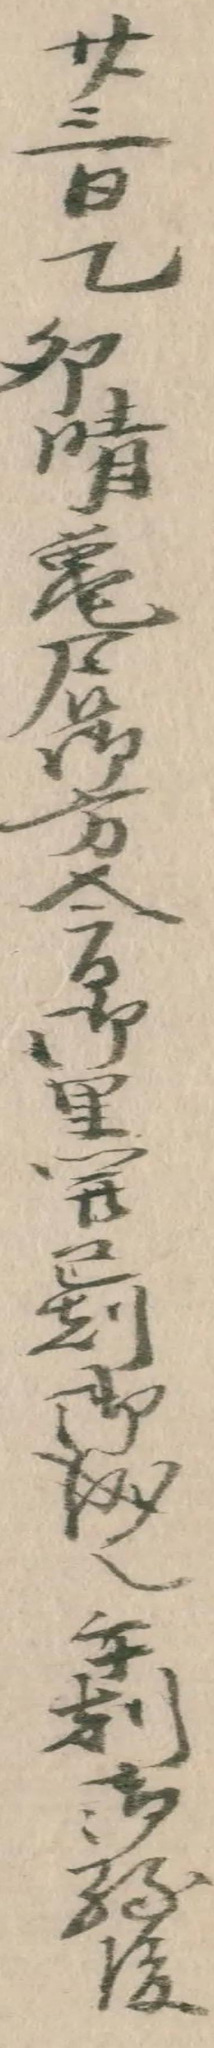廿三日乙卯晴亀君御方今日御里開巳刻御城也午刻御嫁後
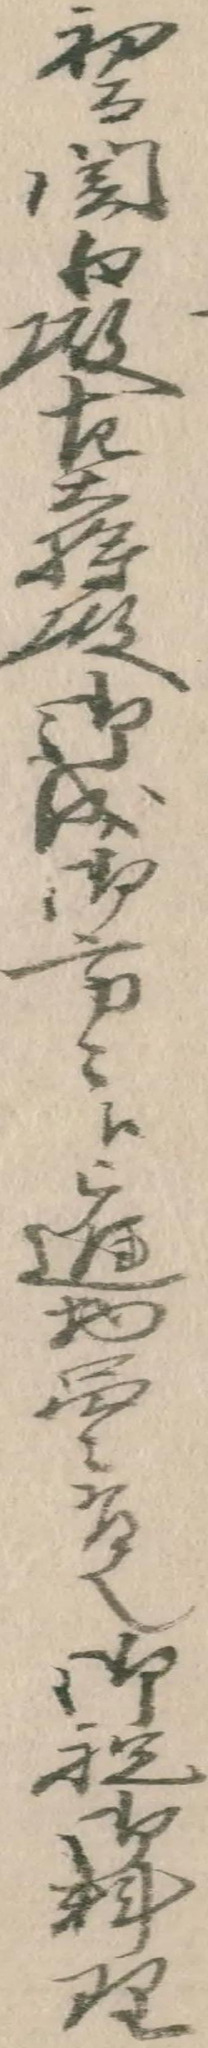初而関白殿左大将殿御成御方々え被進物品々有之御祝御料理
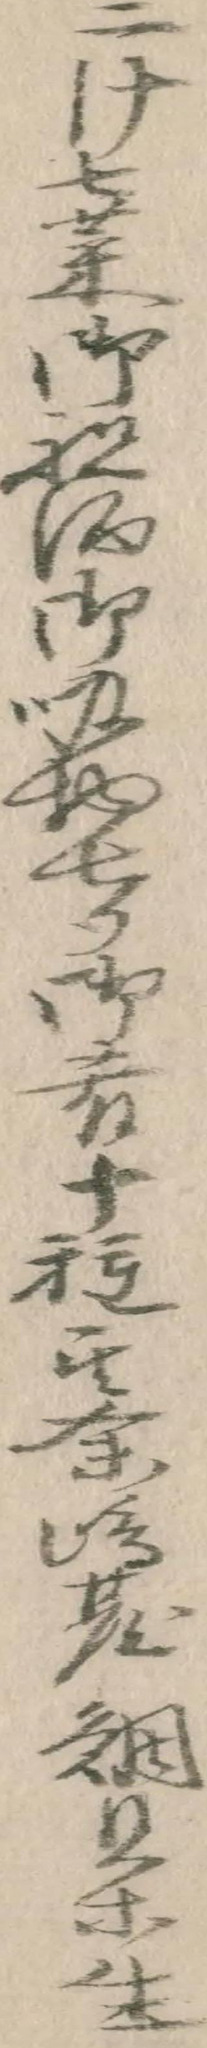二汁七菜御祝酒御吸物七ツ御肴十種其余嶋臺鯛貝等生
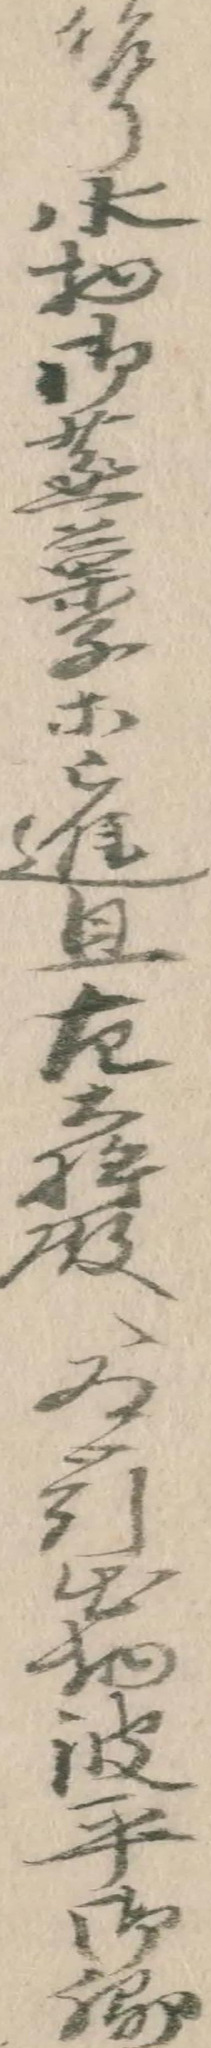作り水物御蒸菓子等被進且左大将殿へ為御引出物彼平御郷
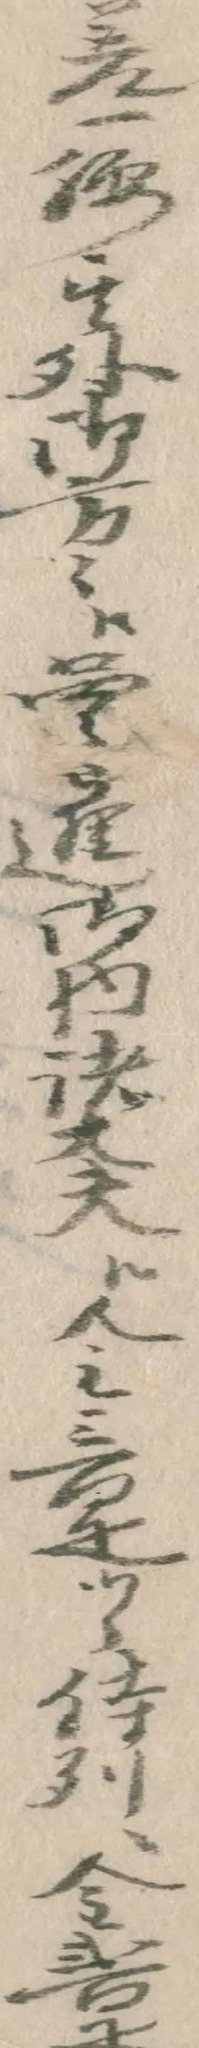差一腰其外御方々江品々被進御内諸大夫え金三百疋ツヽ侍列に金弐百疋
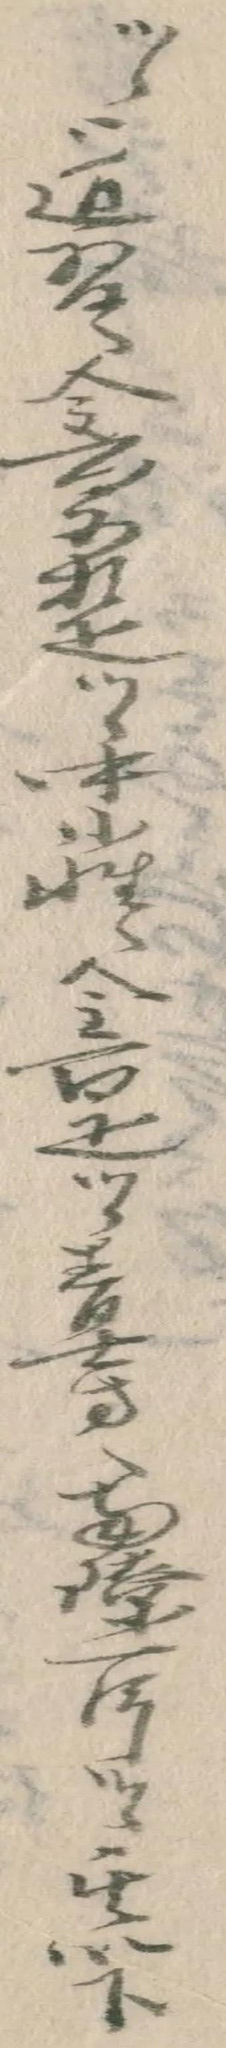ツ御近習へ金百五拾疋ツヽ中小性へ金百疋ツヽ青士方へ南鐐一片ツヽ其以下
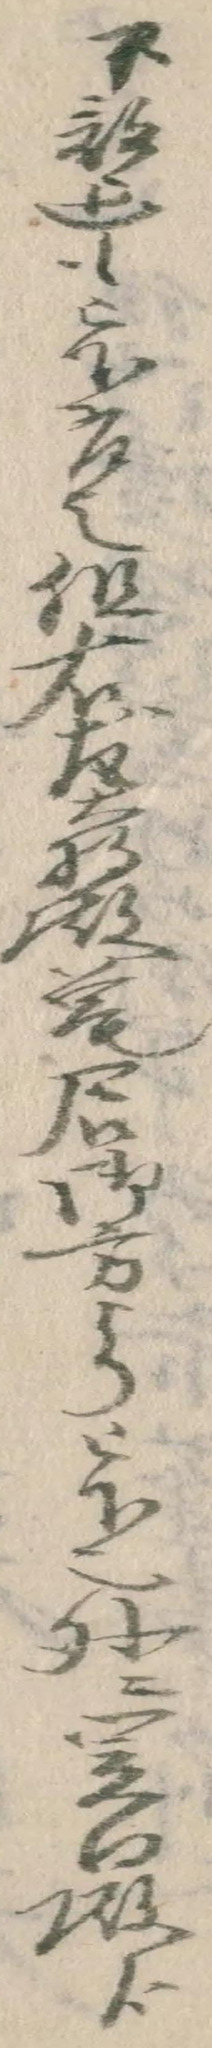下部迄も被下有之但右ハ左大将殿亀君御方より被下也外二関白殿ゟ
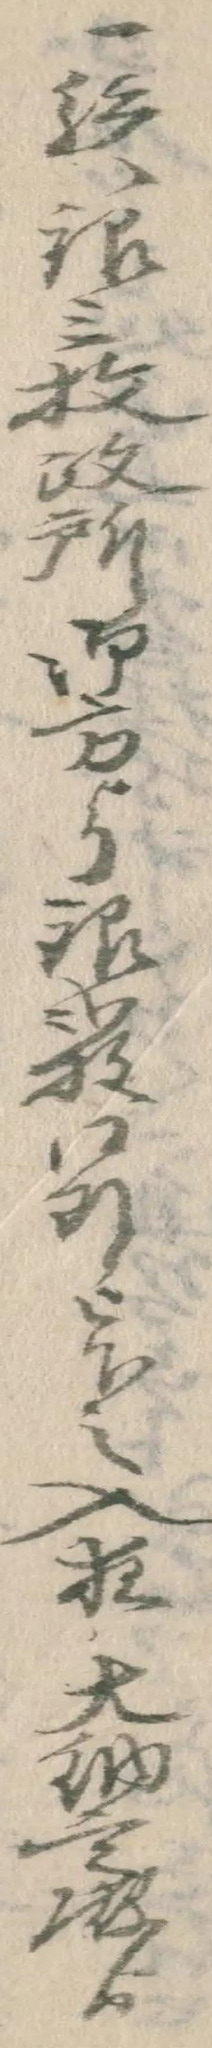一統ヘ銀三枚政所御方より銀弐枚同断被下之入夜大納言殿ゟ
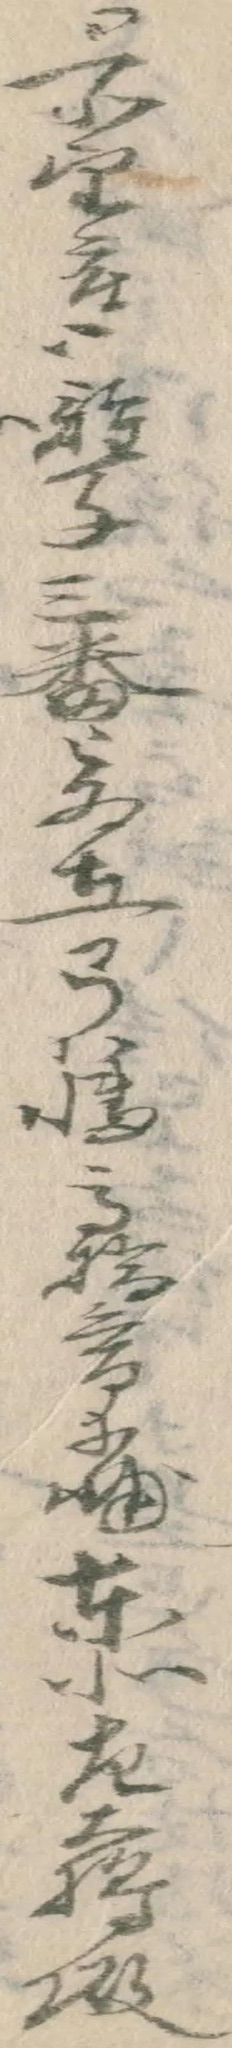御所望ニ付御囃子三番被為在弓八幡高橋兵部少輔東北左大将殿
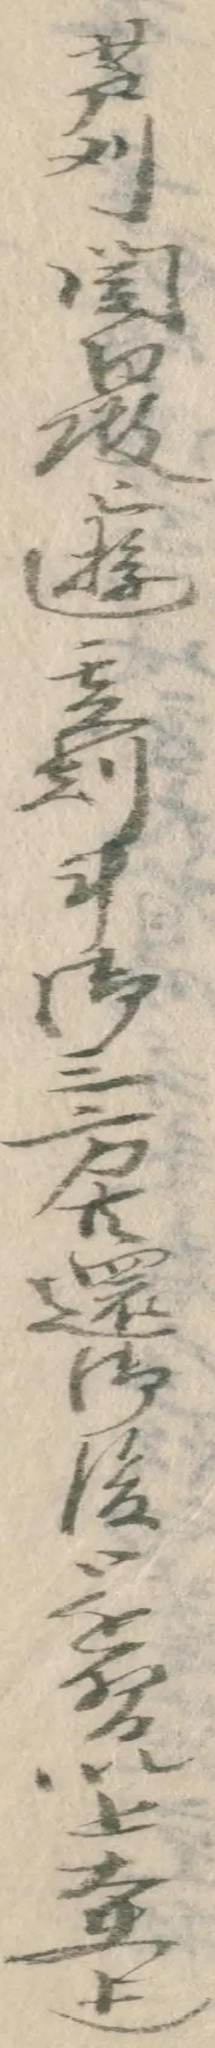芦刈関白殿被遊亥刻斗御三方共還御後御近習以上大夫迄
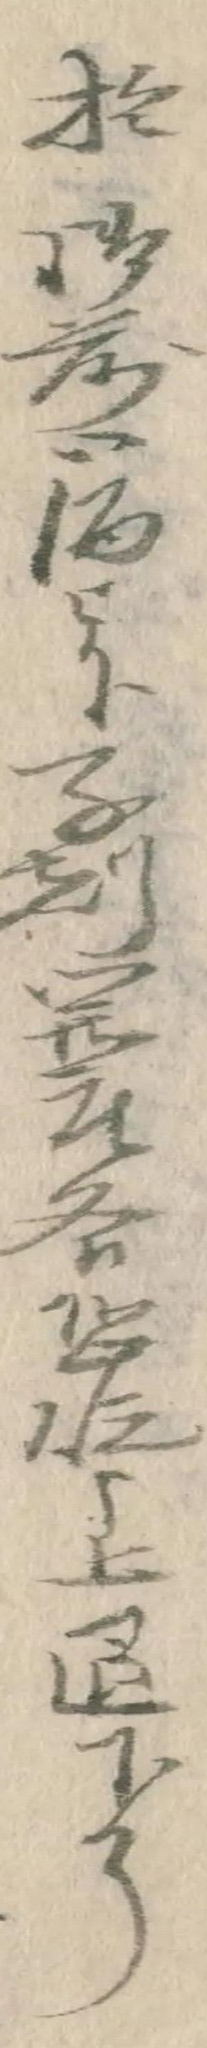於御前御酒被下子刻開座各恐悦申上退下了
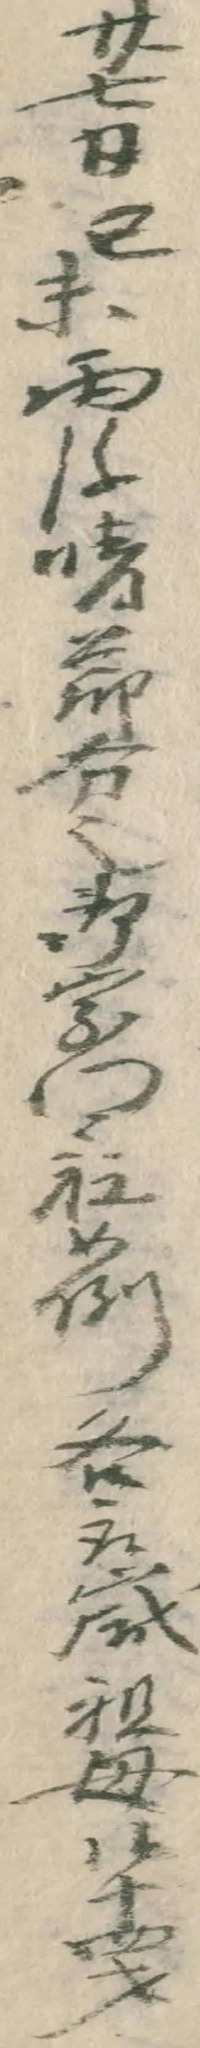廿七日己未雨後晴節分也御家門御祝如例各取歳祖母八十四才

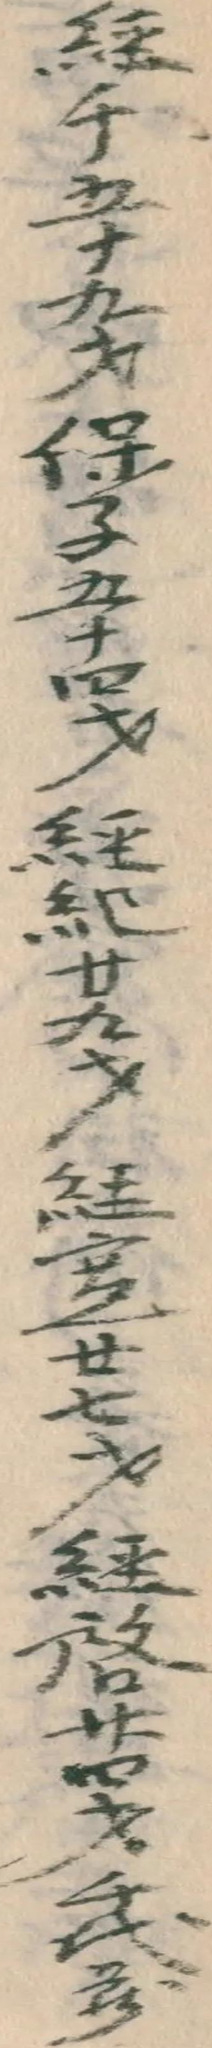経千五十九才保子五十四才経紀廿九才継寛廿七才経啓廿四才千代蔵
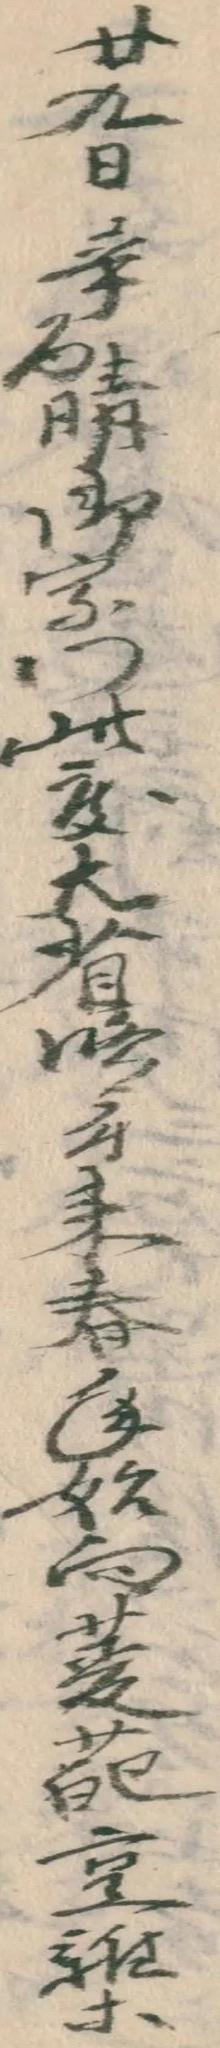廿九日辛酉晴御家門此度大省略ニ付来春年始向菱花葩重等
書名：賀茂社記録. 第69冊
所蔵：国立国会図書館 National Diet Library, JAPAN
